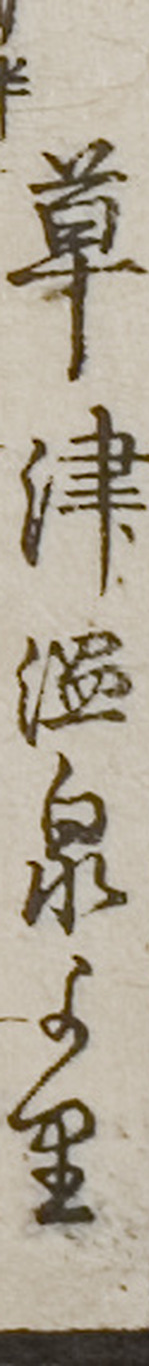草津温泉より
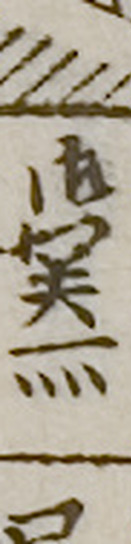御関所
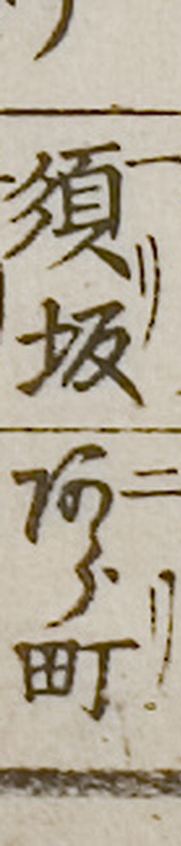一リあら町
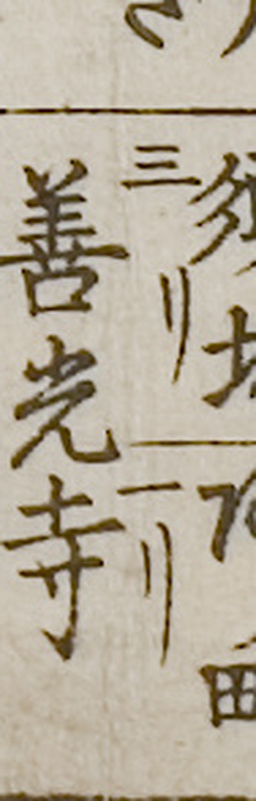善光寺
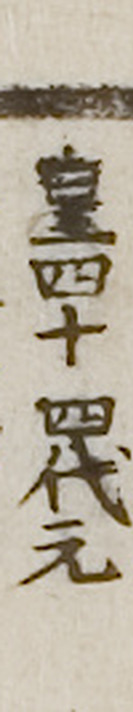皇四十四代元
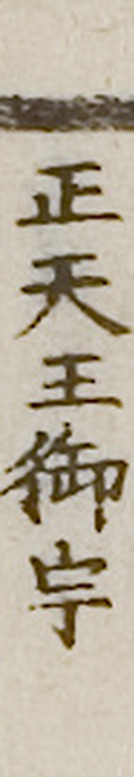正天王御宇
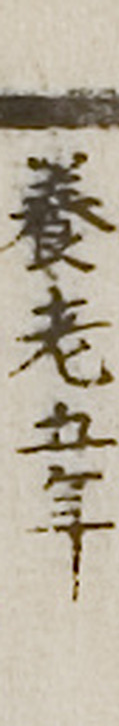養老五年
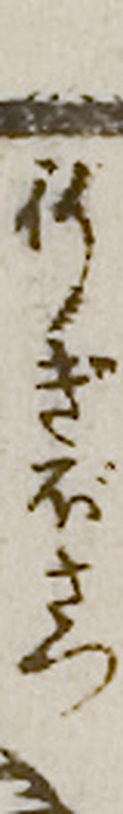行ぎぼさつ
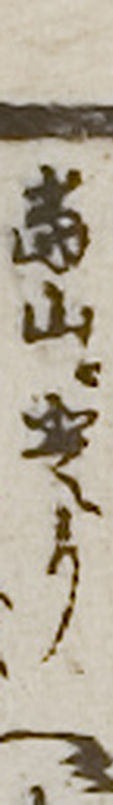当山ニ登リ
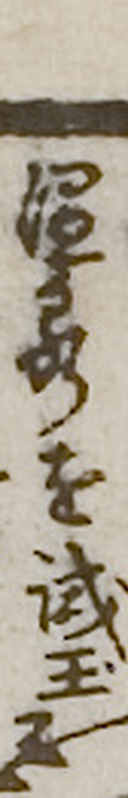温泉を試玉
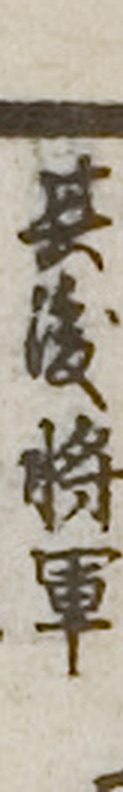其後将軍
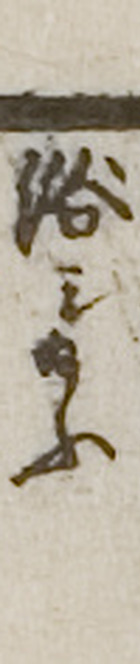浴シ給ふ
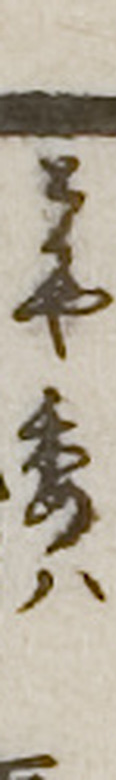とかや委ハ
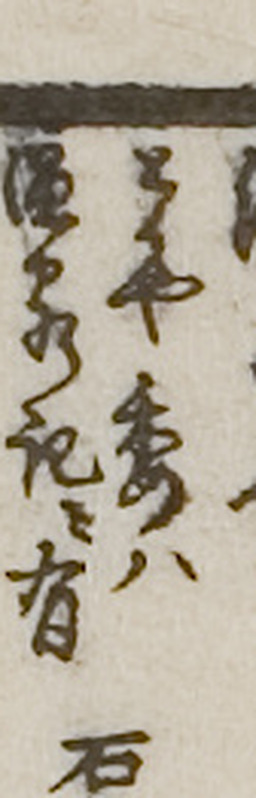温泉記ニ有
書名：上州草津温泉之図
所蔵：東京大学総合図書館 General Library in the University of Tokyo, JAPAN
